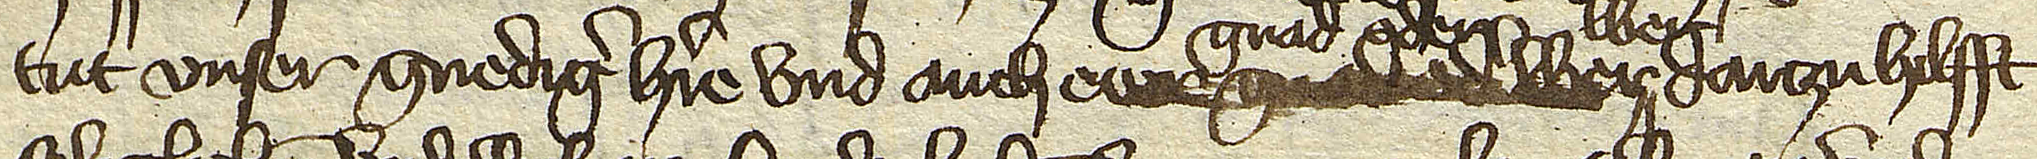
tut vnſer gnedig* hr*e vnd auch ewr gnad od* wer darcʒu hilfft
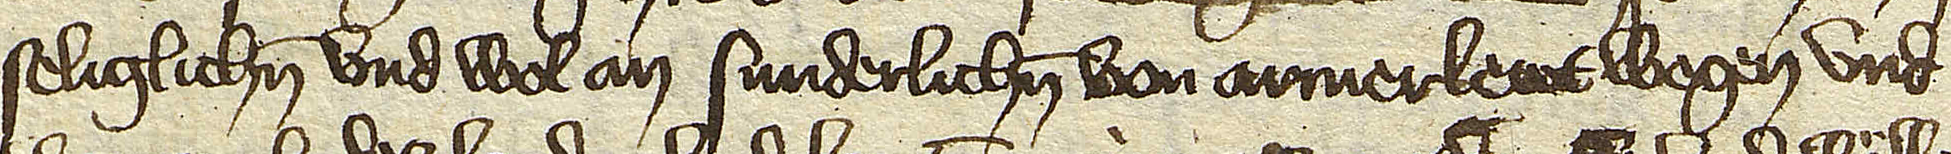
ſeliglichn* vnd wol an ſunderlichn* von armerlewt wegen vnd
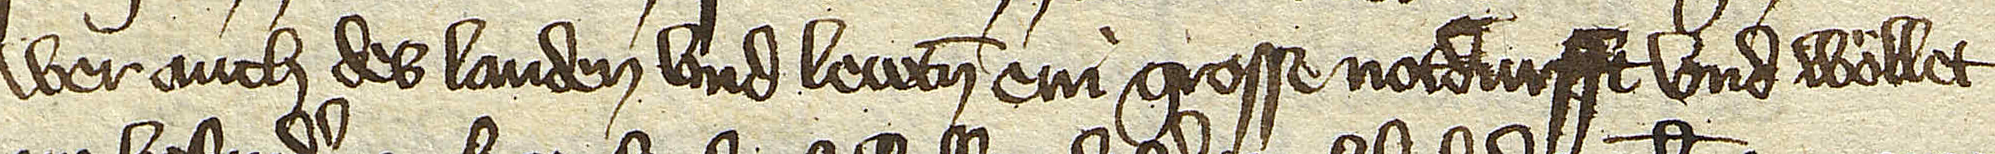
wer auch des landen vnd lewtn* ein groſſe notdurfft vnd wöllet
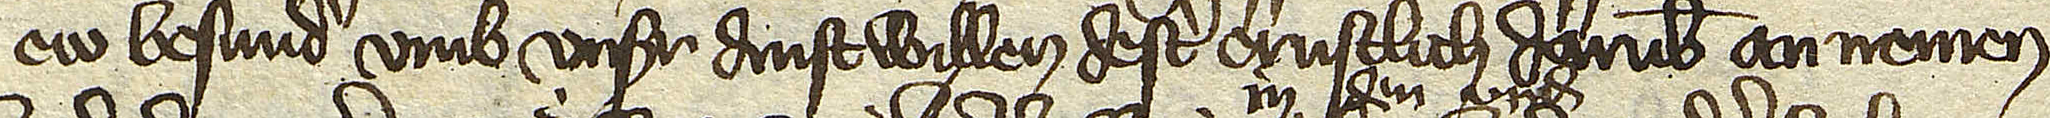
ew beſund* vmb vnſ*r dinſt willen deſt* ernſtlich darub* an nemen
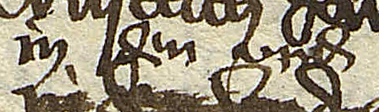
in den vnd
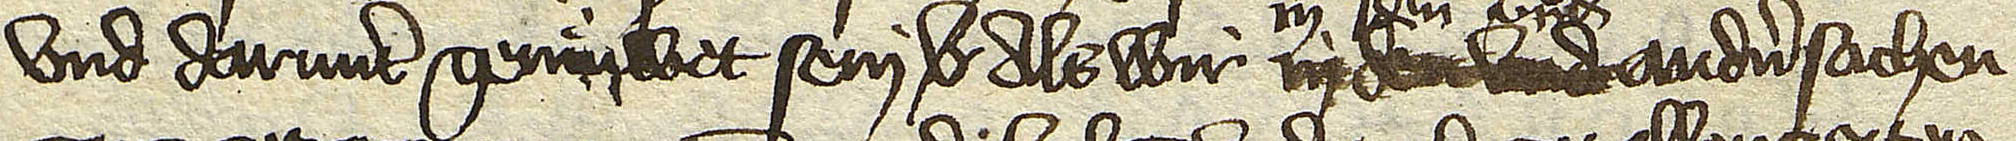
vnd darunt* gemüwet ſein v Als wir in den vnd andn* ſachen
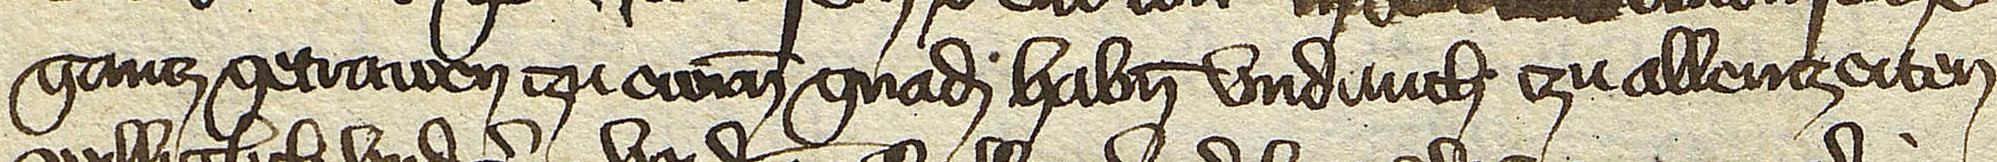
gancʒ getrawen cʒu ewrn* gnad* habn* vnd auch cʒu allencʒeiten
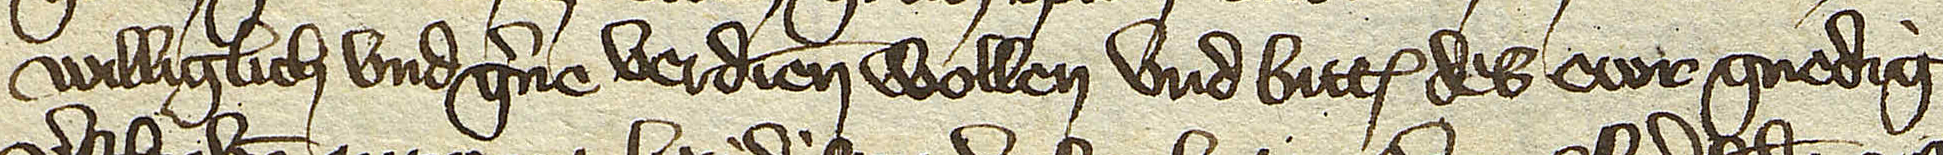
williglich vnd g*ne verdien* wollen vnd bitt* des ewr gnedig
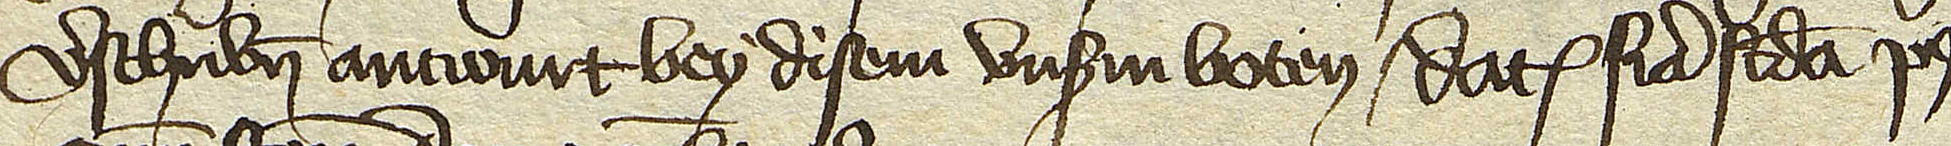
v*ſchribn* antwurt bey diſem vnſ*m boten / dat* fia* ſcda* p*
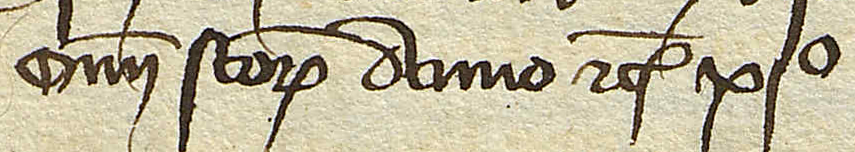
Omi* ſco* Anno ec* xi*
